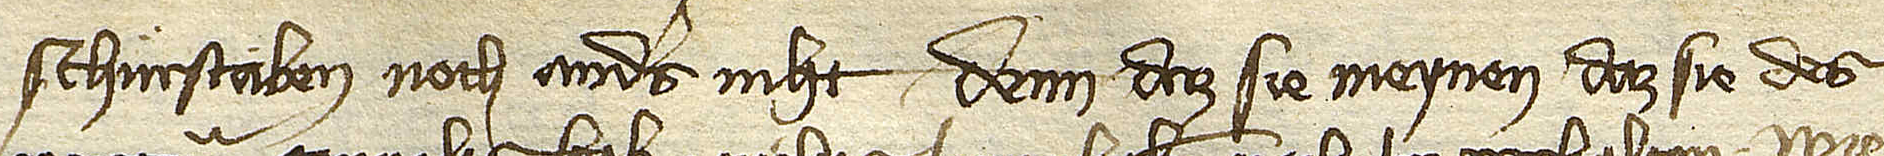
ſchürſtaben noch and*s niht / Denn daʒ ſie meynen daʒ ſie des
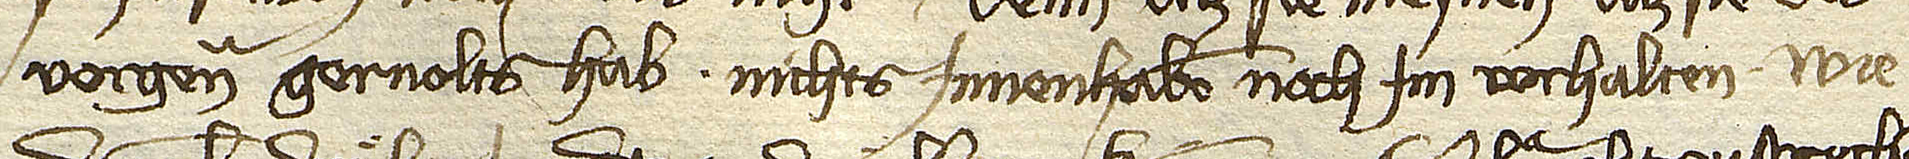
vorgen* gernolts hab . nichts Innenhabe* noch Im vorhalten . wie
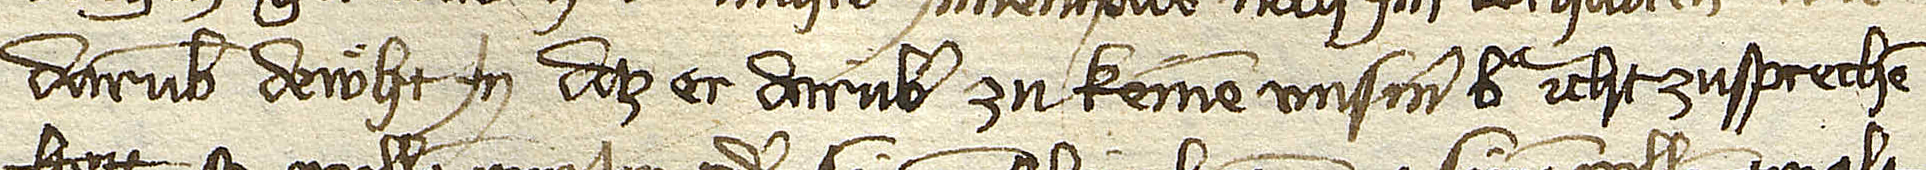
daru*b dewcht In daʒ er darüb* ʒu keine* vnſ*m b* icht ʒuſpreche*
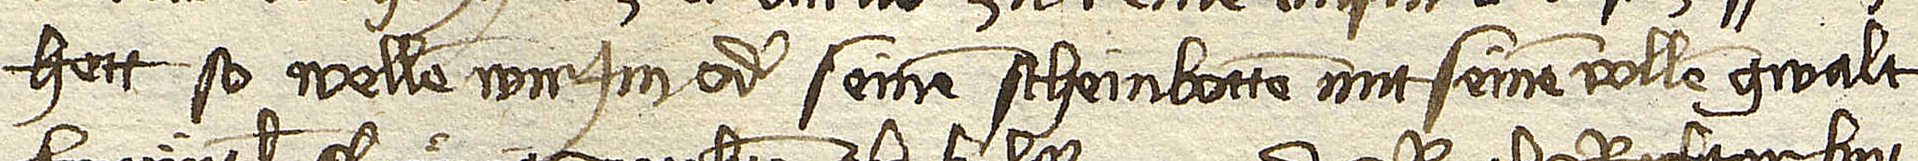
hett ſo welle* wir Im od* ſeine* ſcheinbotte* mit ſeine* volle* gwalt
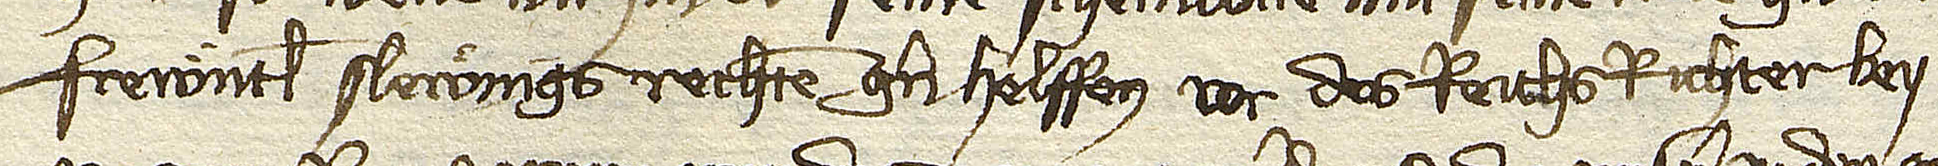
frewntl* ſlewnigs rechte* g*n helffen vor des Reichs Richter bey
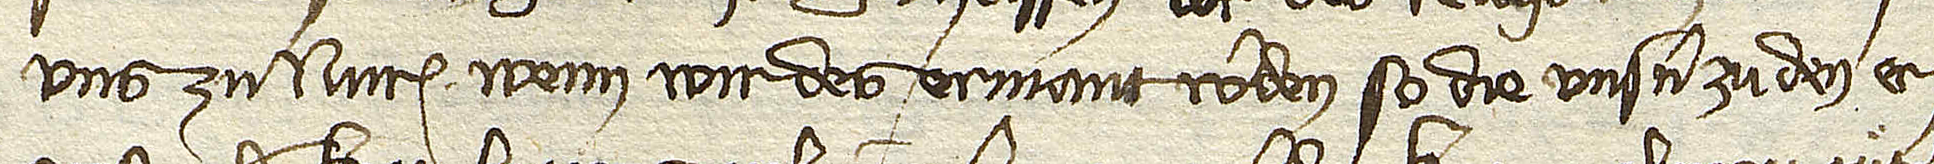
vns ʒu Nur* . wenn wir des ermant w*den ſo die vnſ*n ʒu den er
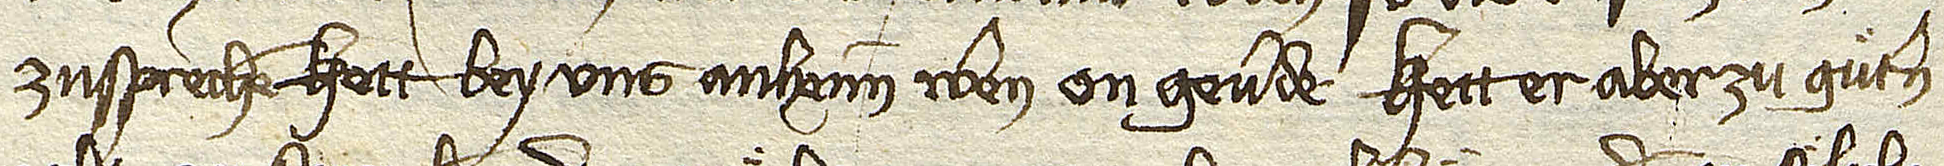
ʒuſpreche* hett bey vns anheim w*en on geu*de . Hett er aber ʒu güt*n
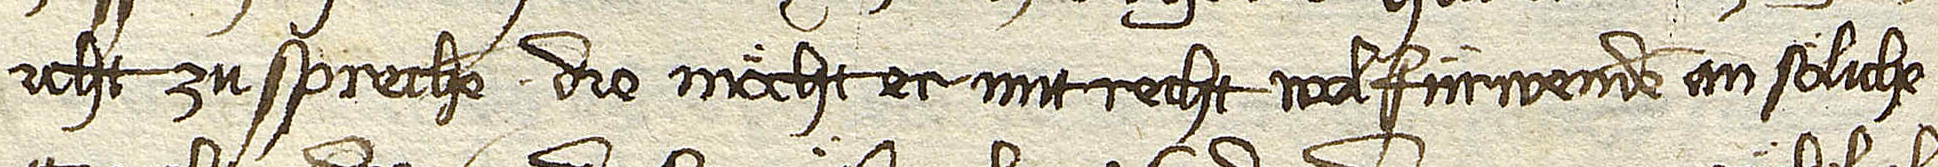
icht ʒu ſpreche* . die möcht er mit recht wol fürwende* an ſöliche
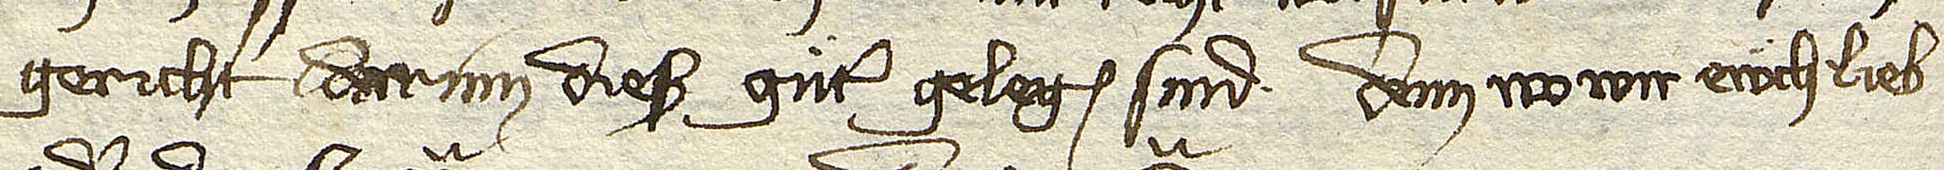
gericht / darinn dieſ* güt* geleg* ſind . denn wo wir ewch lieb
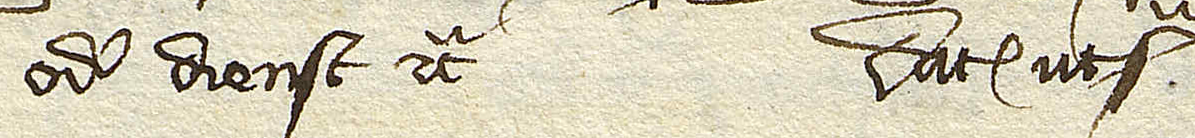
od* dienſt ec* Dat* ut ſ*
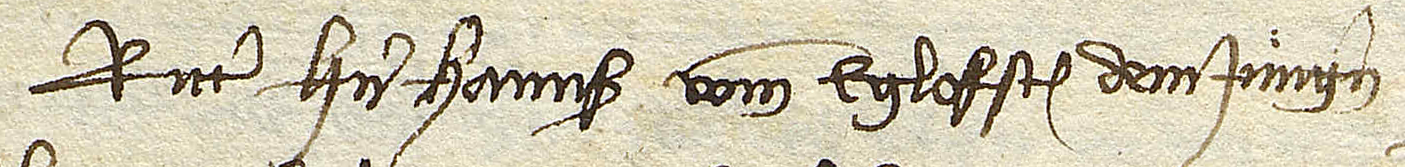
Ritt* h*n hannſ* vom* Eglofſt* dem Iüng*n
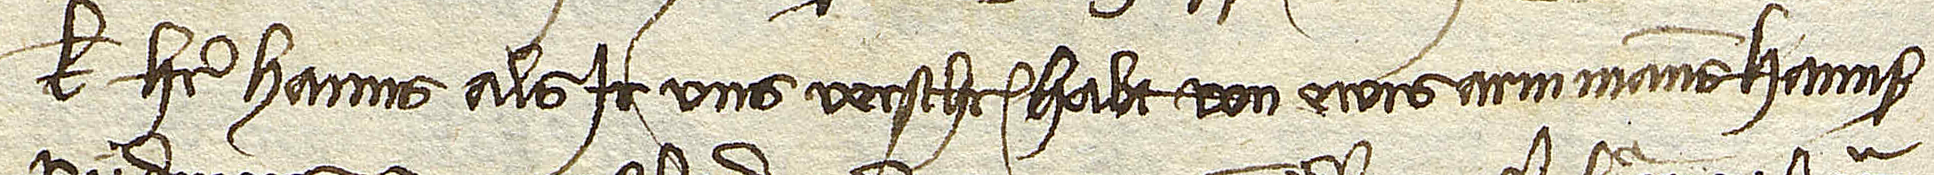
L* h*r hanns als Ir vns verſchr* habt von ewrs arm man*s hannſ*
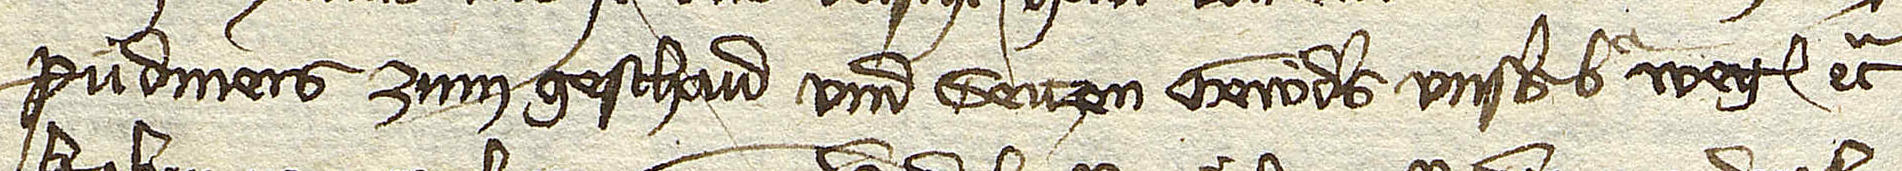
Püdmers ʒum geſchaid vnd Seicʒen Gewd*s vnſ*s b* weg* ec*
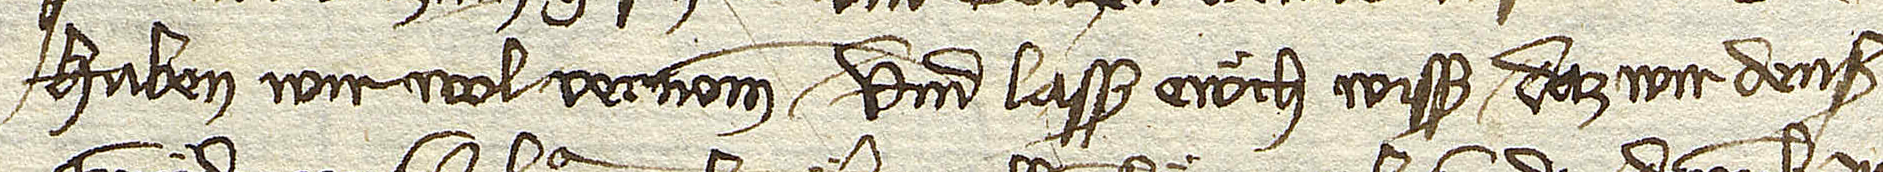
haben wir wol vernom* / Vnd laſſ* ewch wiſſ* / daʒ wir denſ*
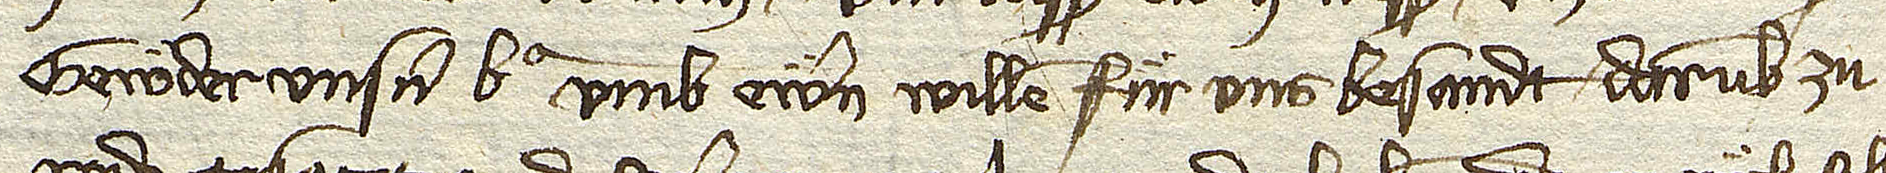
Gewder vnſ*n b* vmb ew*n wille* für vns beſandt / daru*b ʒu
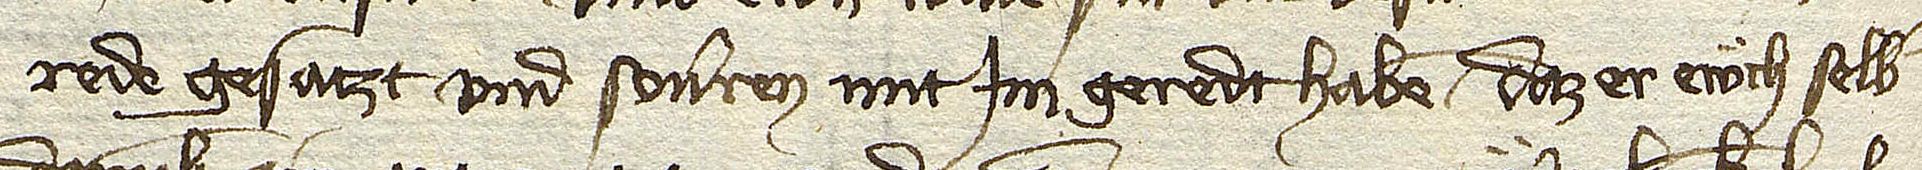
rede geſacʒt vnd ſou*ren mit Im geredt habe* / daʒ er ewch ſelb*
